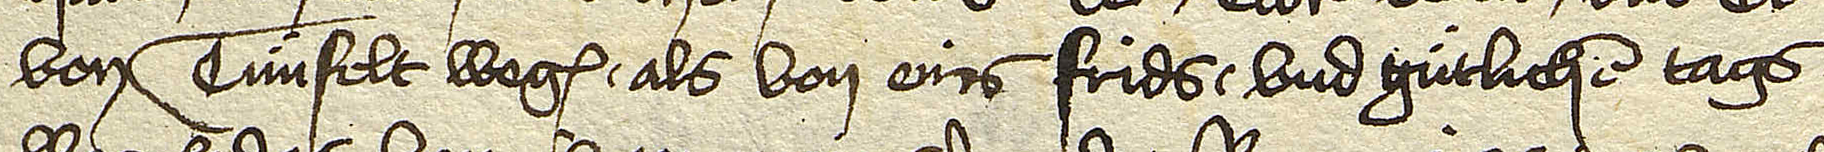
von Tünfelt weg* / als von eins frids / vnd gütliche* tags
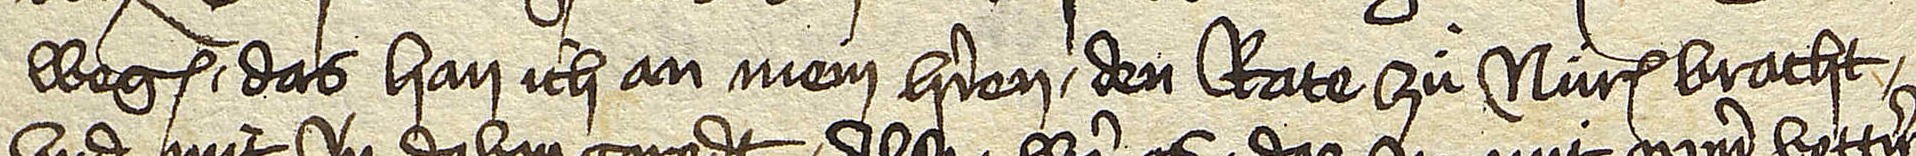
weg* / das han ich an mein h*ren / den Rate cʒü Nür* bracht /
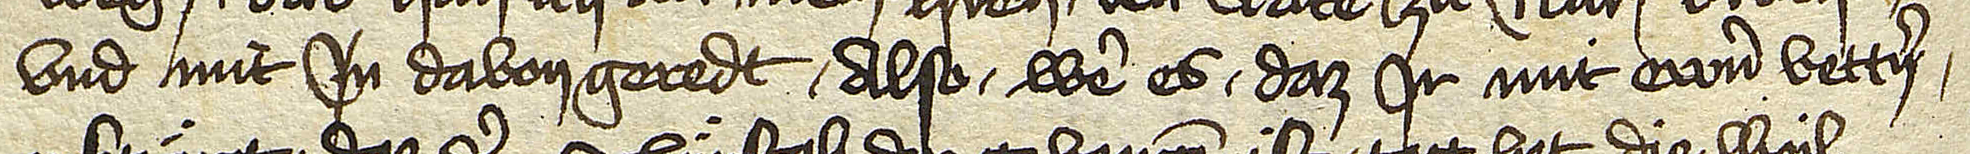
vnd mit In davon geredt / Alſo / we* es / daʒ Ir mit ewn* vettn* /
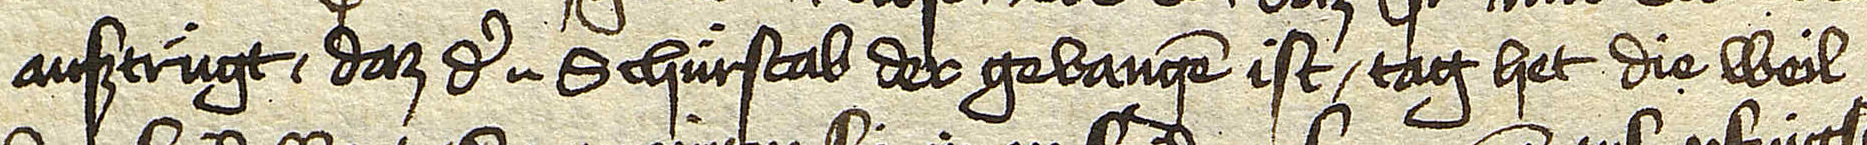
auſʒtrügt / daʒ d* ~ Schürſtab der gevange* iſt / tag het die weil
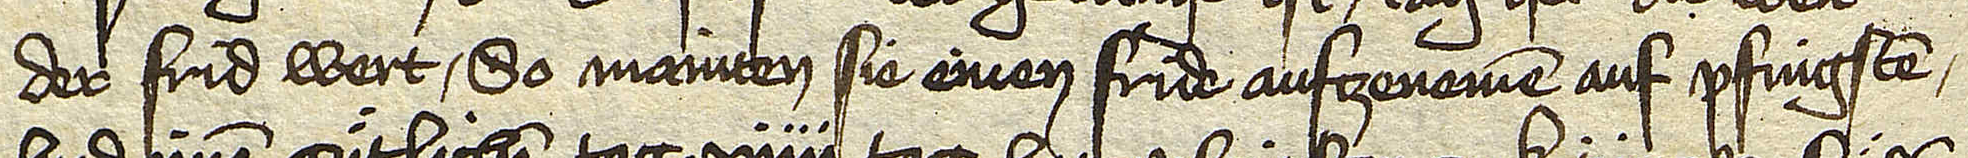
der frid wert / So mainten ſie einen fride aufcʒeneme* auf pfingſte* /
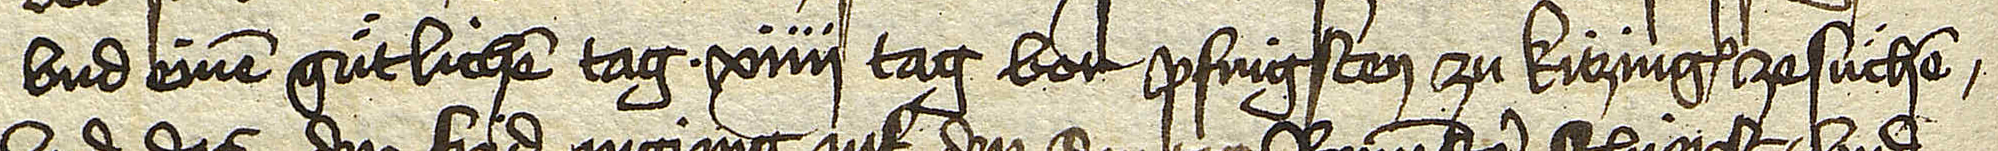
vnd eine* gütliche* tag . xiiii tag vor pfingſten cʒu kitʒing* cʒeſüche* /
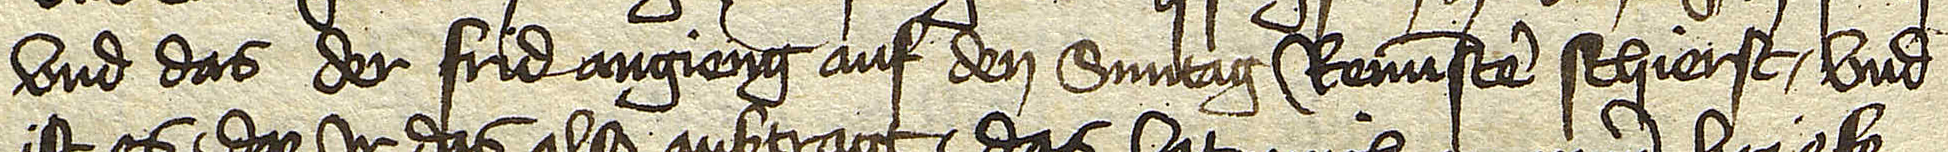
vnd das der frid angieng auf den Sunntag Remiſce* ſchierſt / vnd
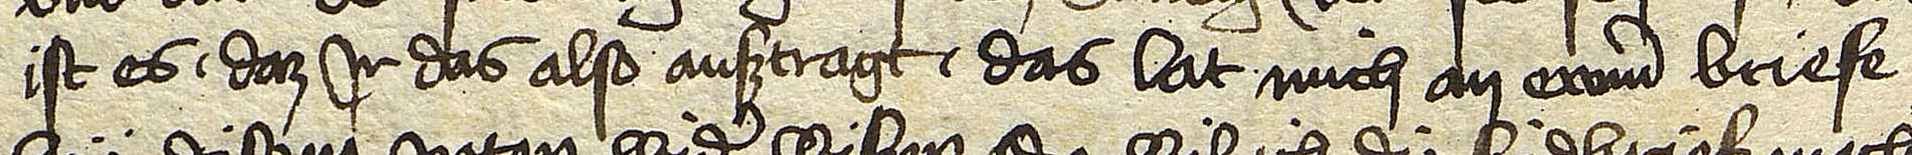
iſt es / daʒ Ir das alſo auſʒtragt / das lat mich an ewm* briefe
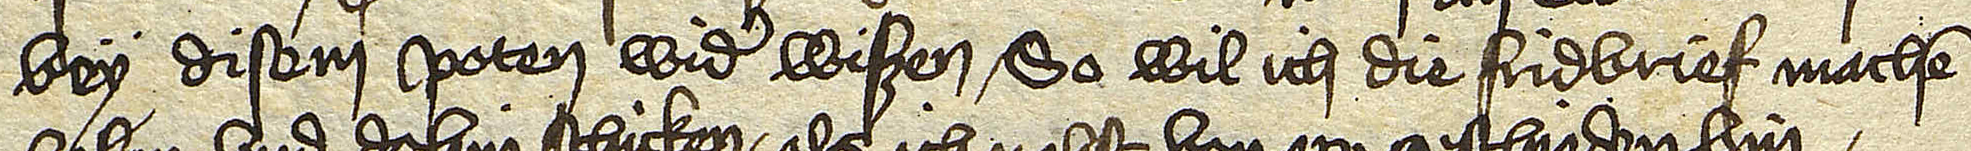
bey diſem poten wid* wiſʒen / So wil ich die fridbrief mache*
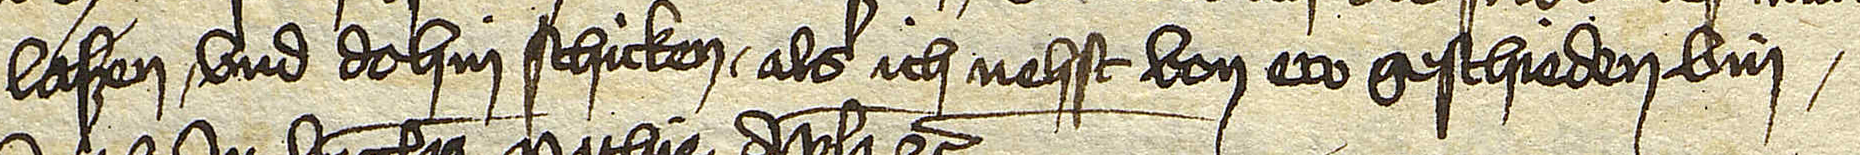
laſʒen / vnd dohin ſchicken / als ich nehſt von ew geſchieden bin /
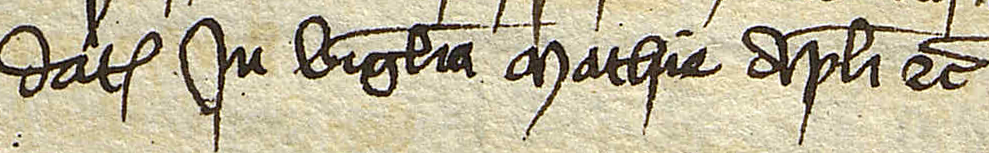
dat* In viglia* Mathie Aph* ec*
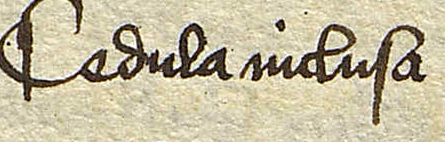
Cedula incluſa
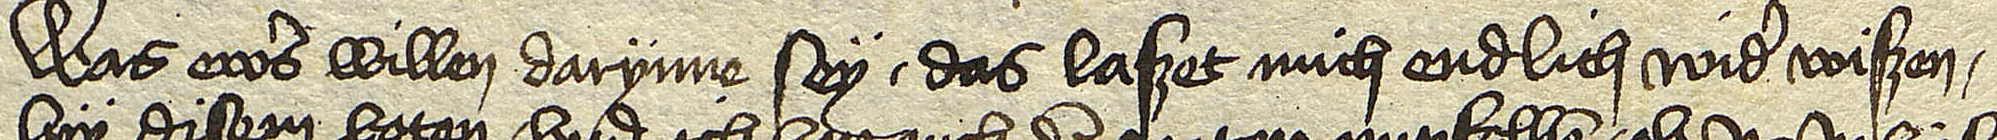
Was ews* willen darynne ſey / das laſʒet mich endlich wid* wiſʒen /
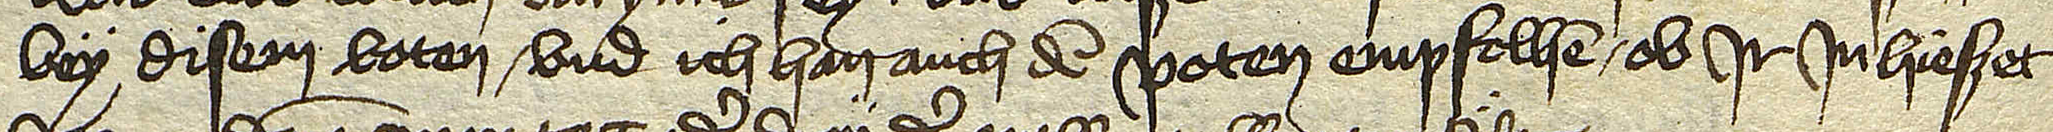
bey diſem boten / vnd ich han auch d* poten empfolhe* / ob Ir In hieſʒet
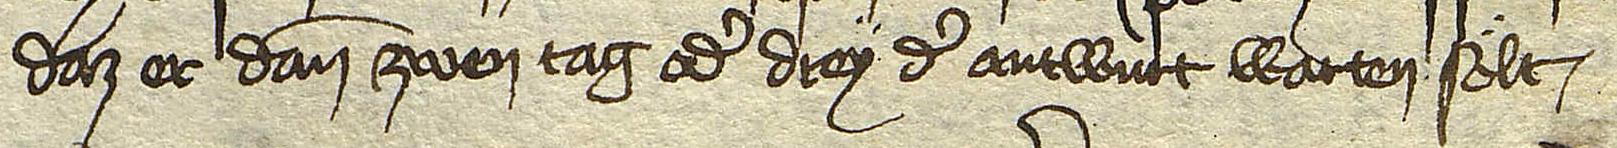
daʒ er dan* cʒwen tag od* drey d* antwurt warten ſölt /
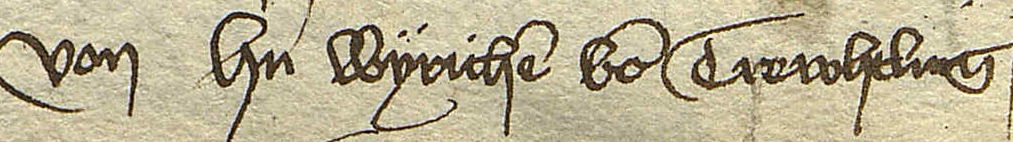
von hn* wyriche* vo* Trewhtling*
